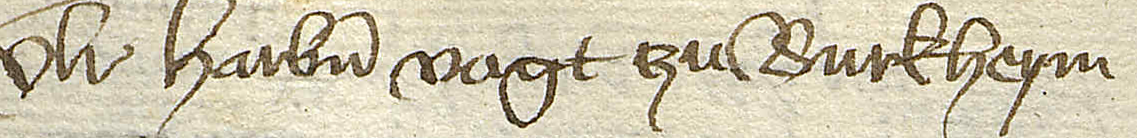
Vlr* harb*n vogt cʒu Burkheym
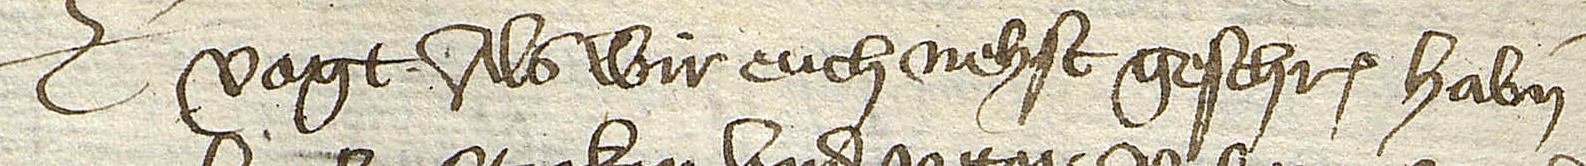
L* vogt . Als wir euch nehſt geſchr* hab*n
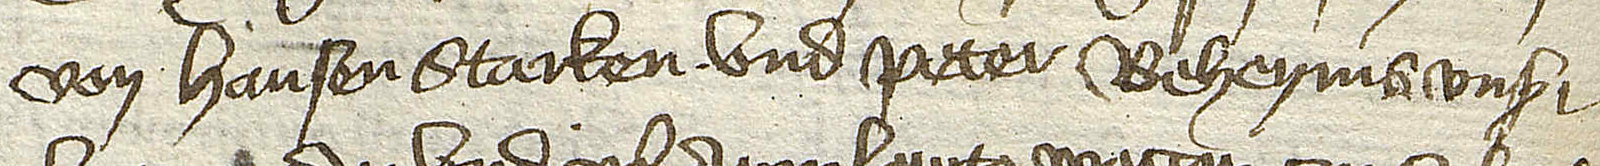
von hanſen Starken . vnd peter Beheyms vnſ*r
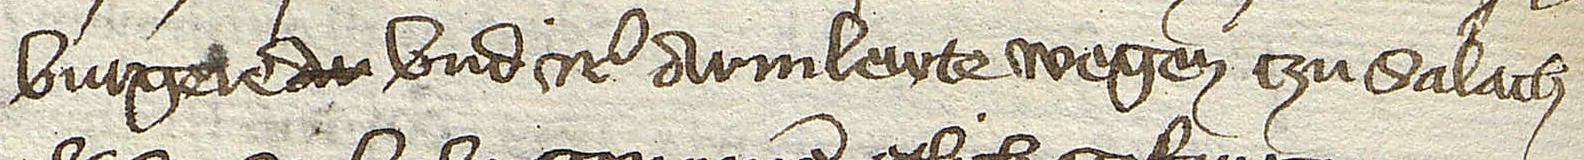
burgere Ar vnd ir* Armlewte wegen cʒu Salach
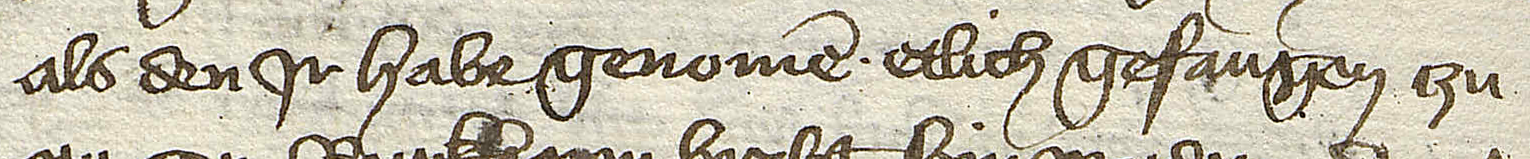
als den Ir habe genome* . etlich gefangen cʒu
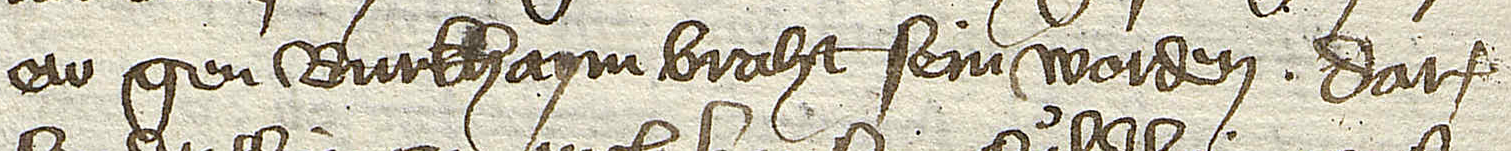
ew gen Burkhaym braht ſein worden . Dar*
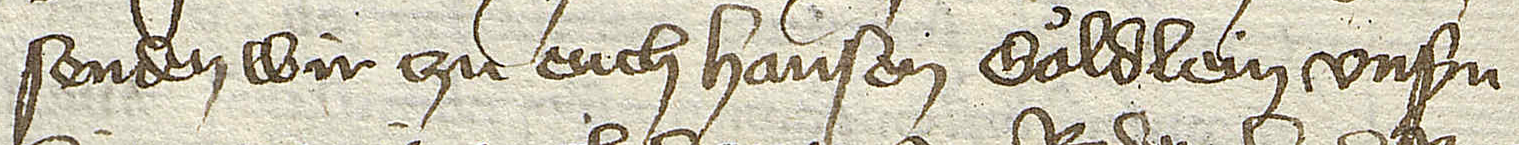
ſenden wir cʒu euch hanſen Göldlein vnſ*n
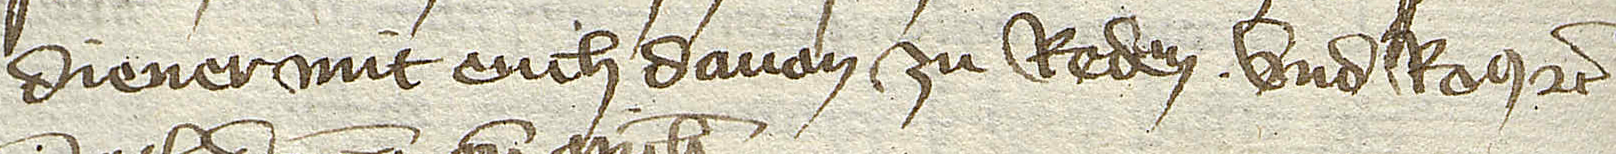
diener mit euch dauon cʒu Reden . vnd Ro* ec*
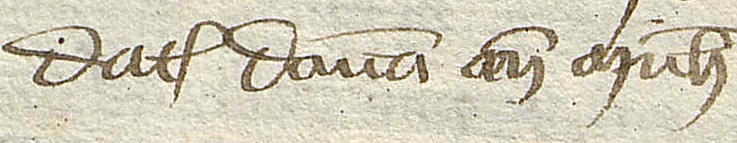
dat* doica* an* Mich*
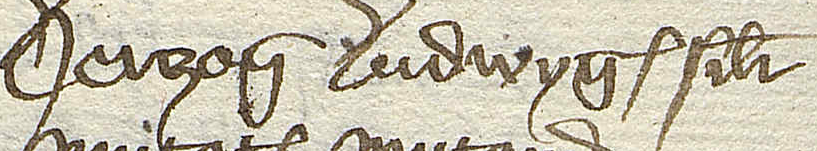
Hercʒog Ludwyg* ſilrr*
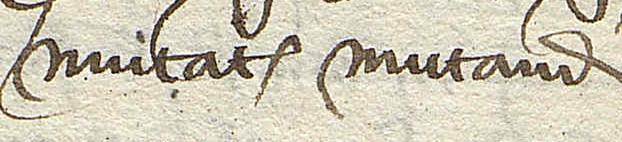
mutat* mutand*
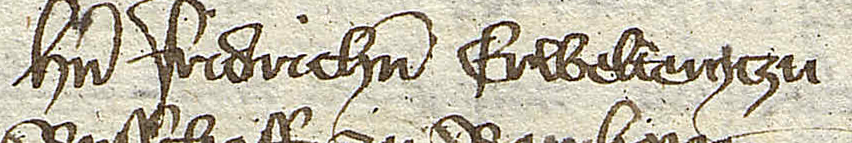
h*n Fridrich*n Erweltem cʒu
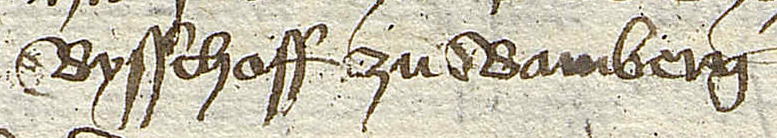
Byſſchoff ʒu Bamberg
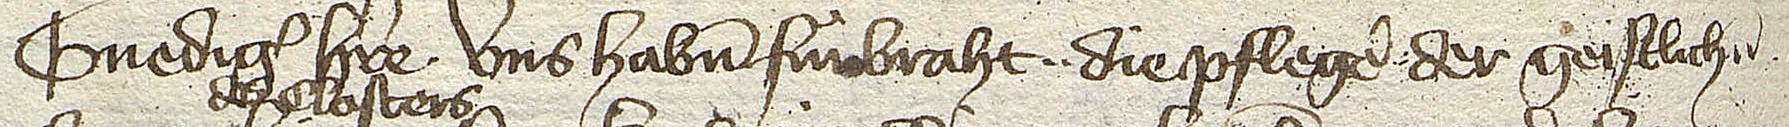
Gnedig* h*re . Vns hab*n fürbraht ~ die pflege* der geiſtlich*n
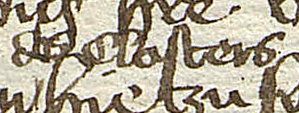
des Cloſters
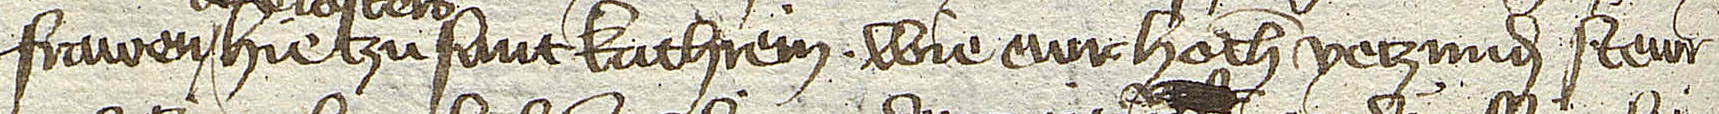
frawen hie cʒu ſant kathrein . wie ewr hoch* yecʒund* ſtewr
